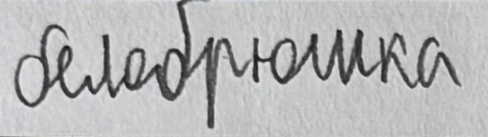белобрюшка
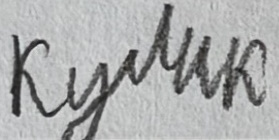кулик
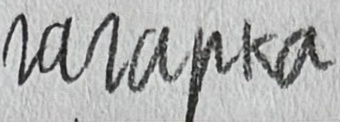гагарка
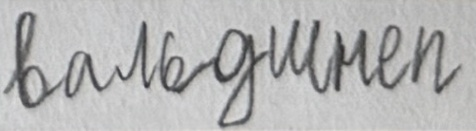вальдшнеп
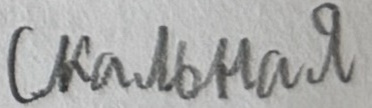скальная
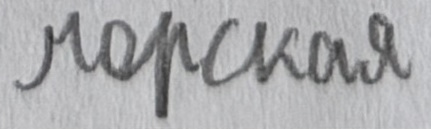морская
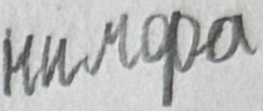нимфа
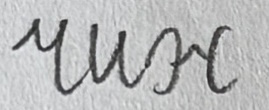чиж
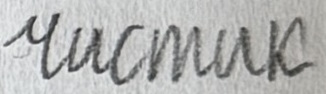чистик
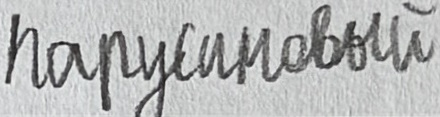парусиновый
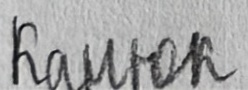канюк
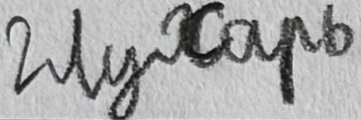глухарь
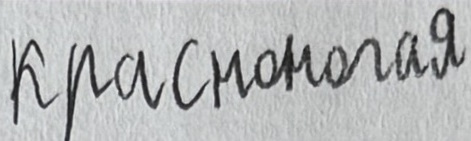красноногая
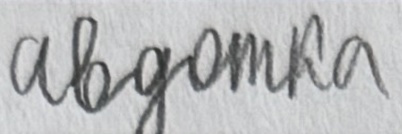авдотка
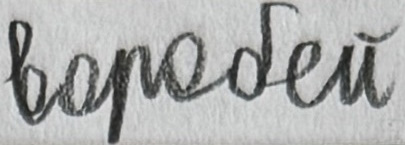воробей
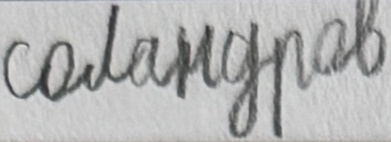соландров
